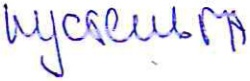пустельга
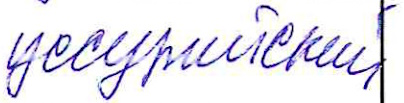уссурийский
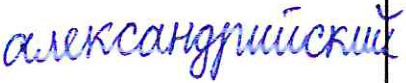александрийский
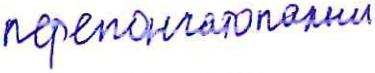перепончатопалыи
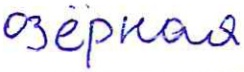озёрная
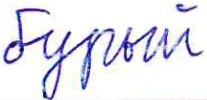бурый
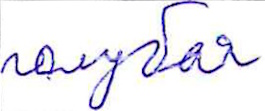голубая
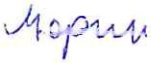люрик
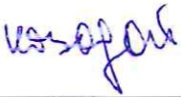козодай
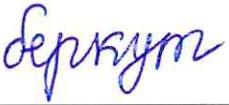беркут
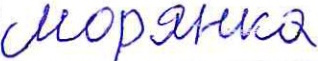морянка
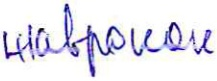жавронок
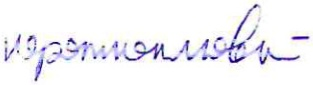короткоклювй
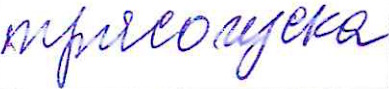трясогуска
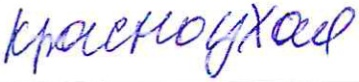красноухая
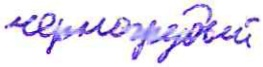черногрудый
